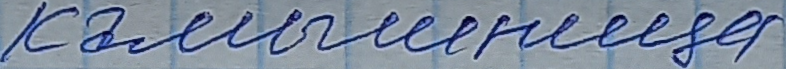камышница
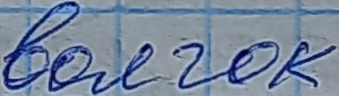волчок
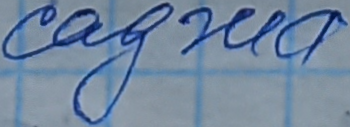саджа
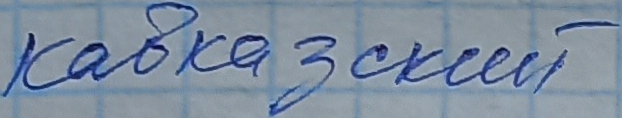кавказский
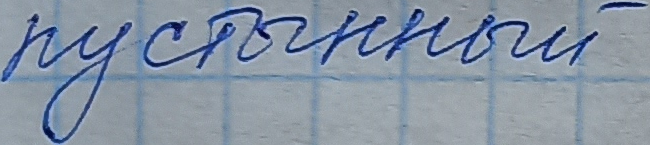пустынный
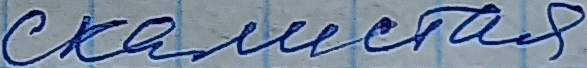скалистая
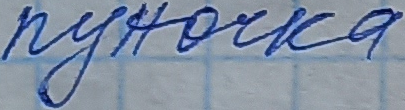пуночка
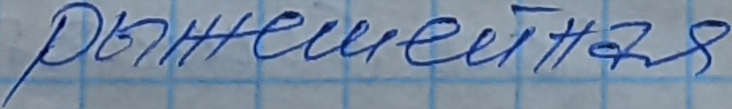рыжешейная
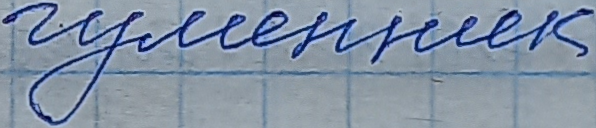гуменник
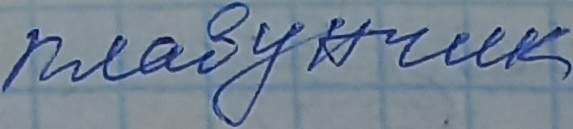плавунчик
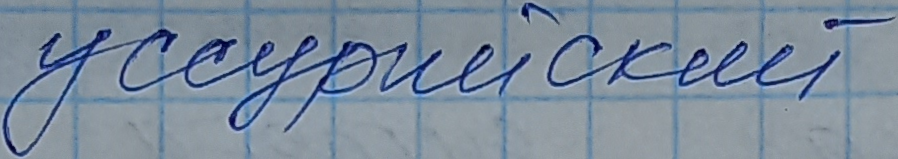уссурийский
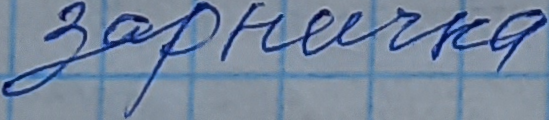зарничка
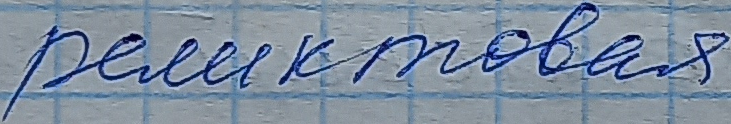реликтовая
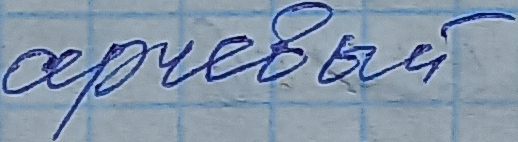арчевый
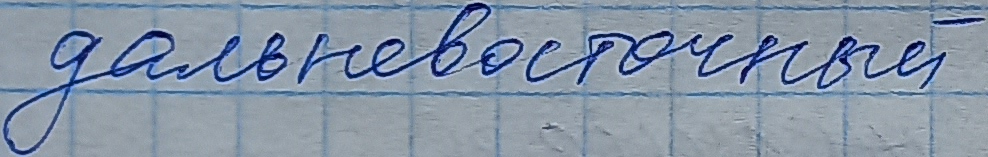дальневосточный
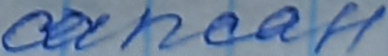сапсан
